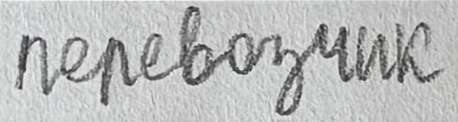перевозчик
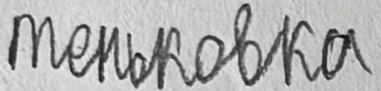теньковка
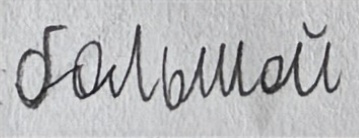большой
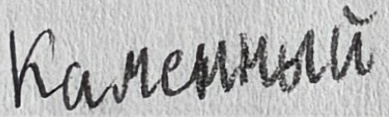каменный
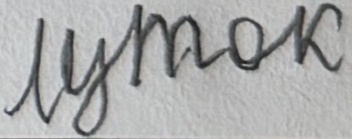луток
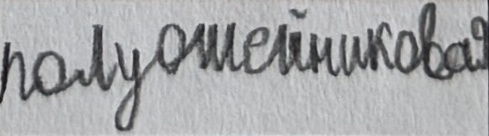полуошейниковая
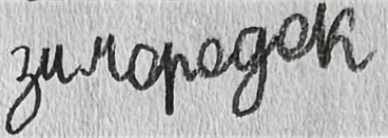зимородок
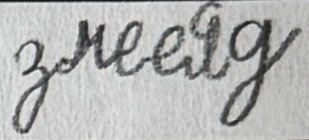змееяд
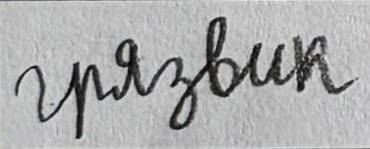грязвик
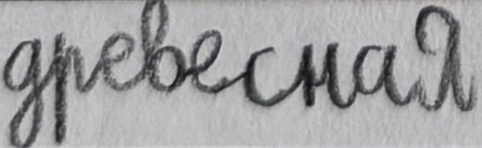древесная
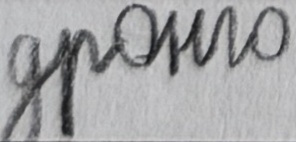дронго
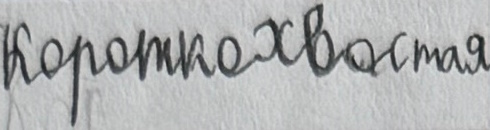короткохвостая
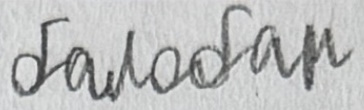балобан
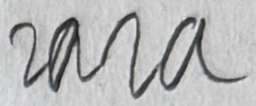гага
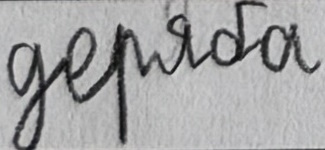деряба
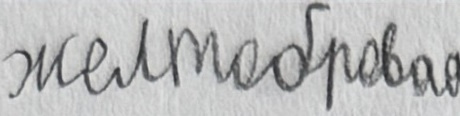желтобровая
